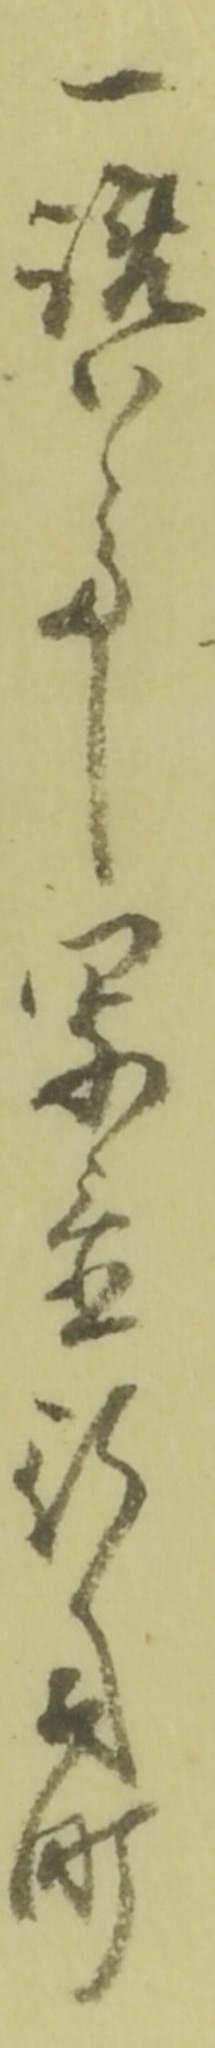一覧いたし写置行司町
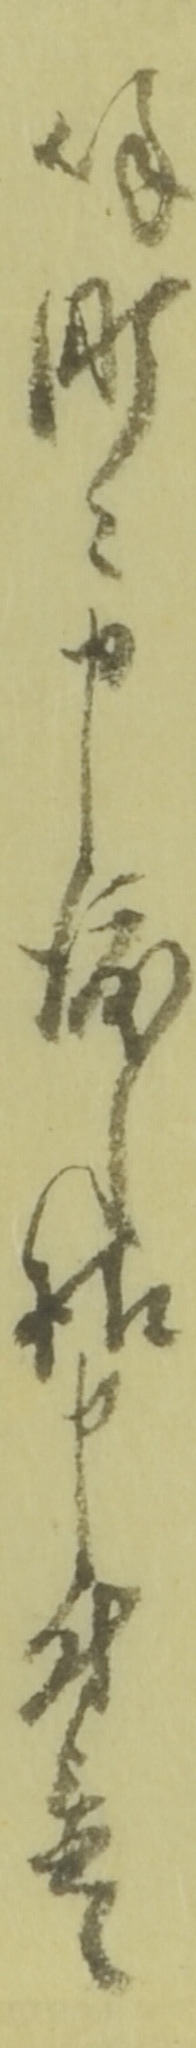呼町ニ申渡候様申付置候

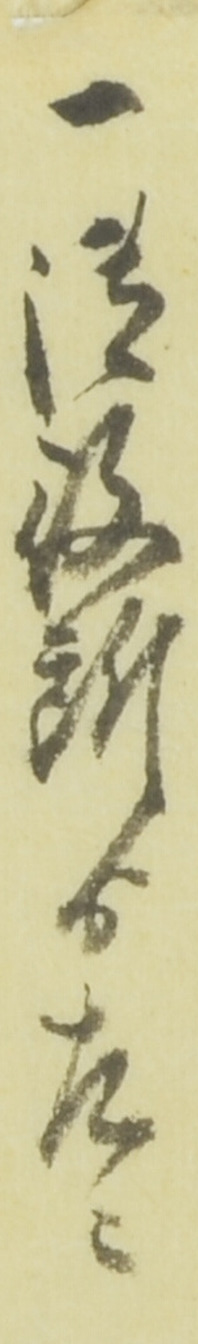一御役所ゟ左ニ
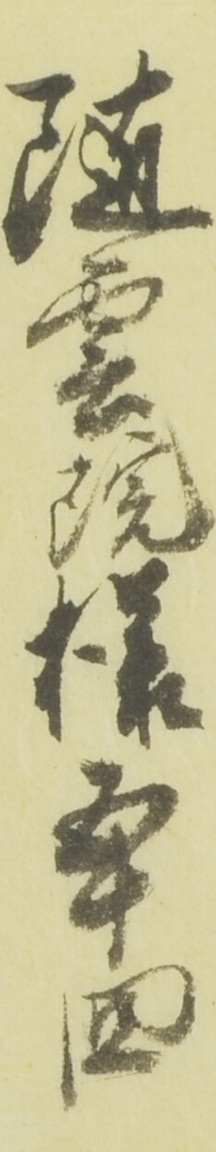随雲院様五十回
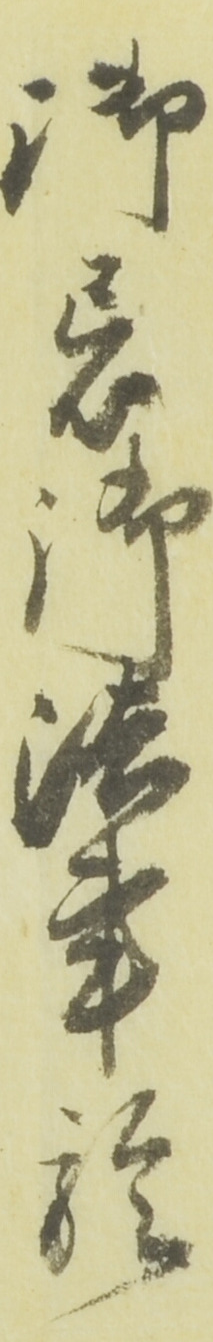御忌御法事於
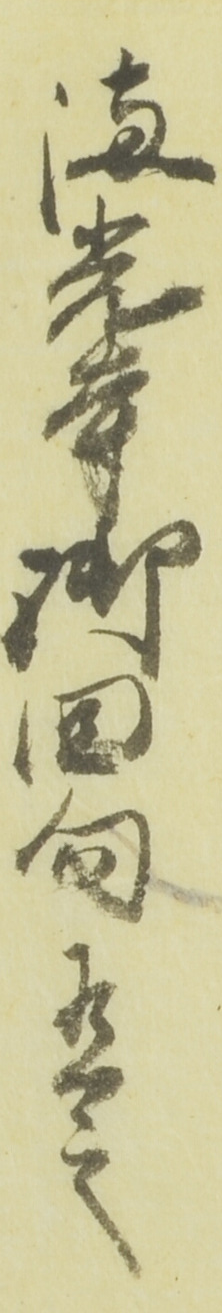満光寺御回向有之
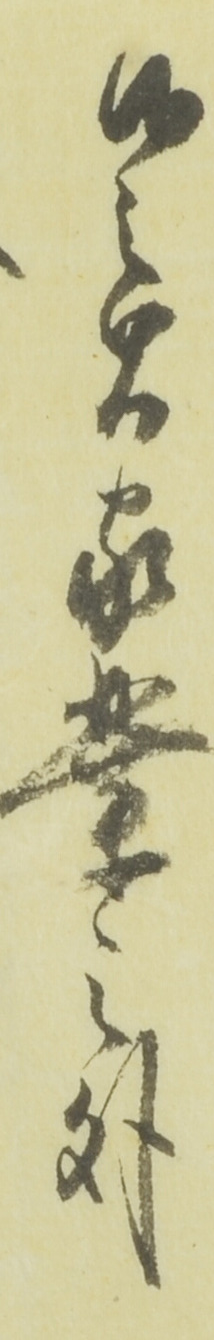候之間家業之外
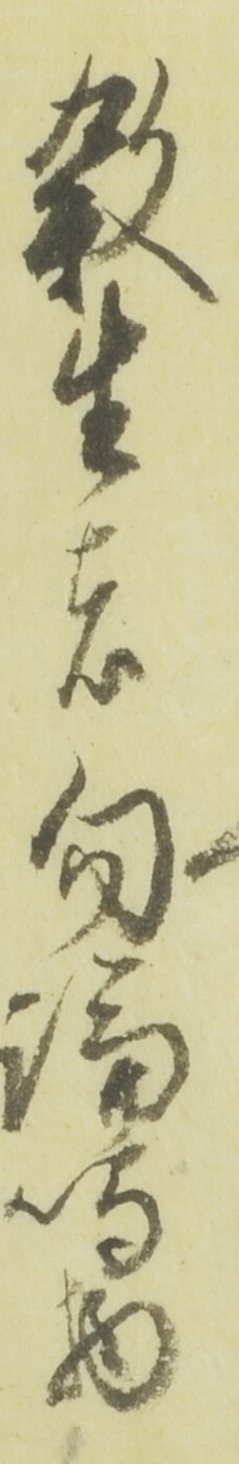殺生は勿論鳴物
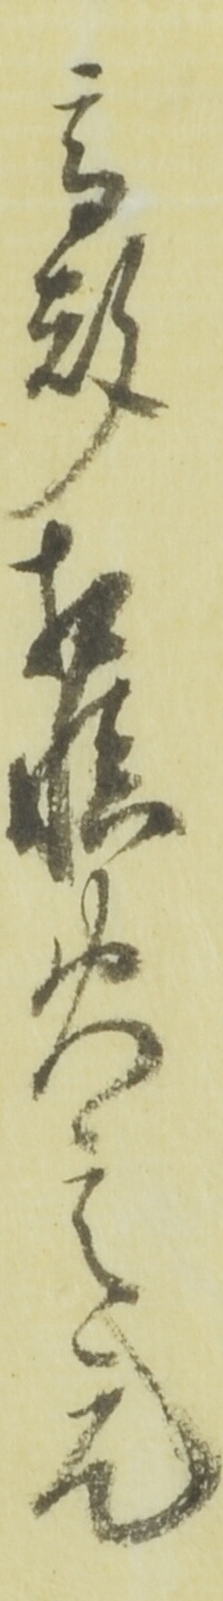高声相慎火之元
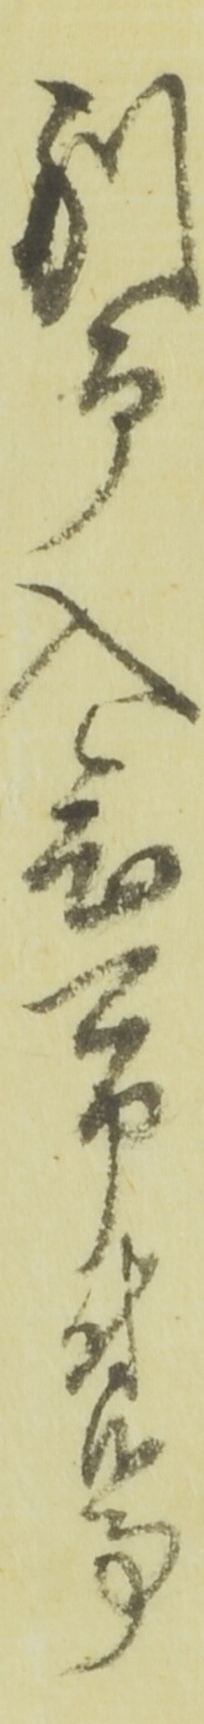別而入念可申付候事
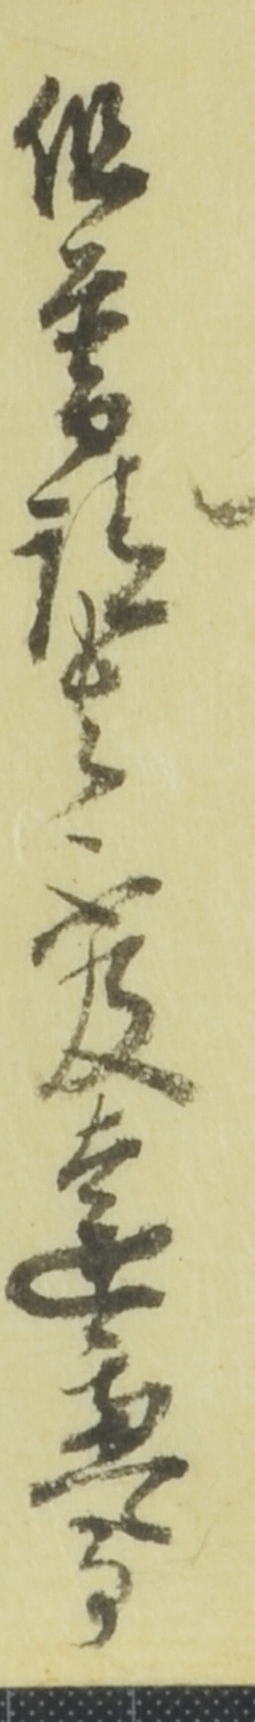但普請は不及遠慮候事
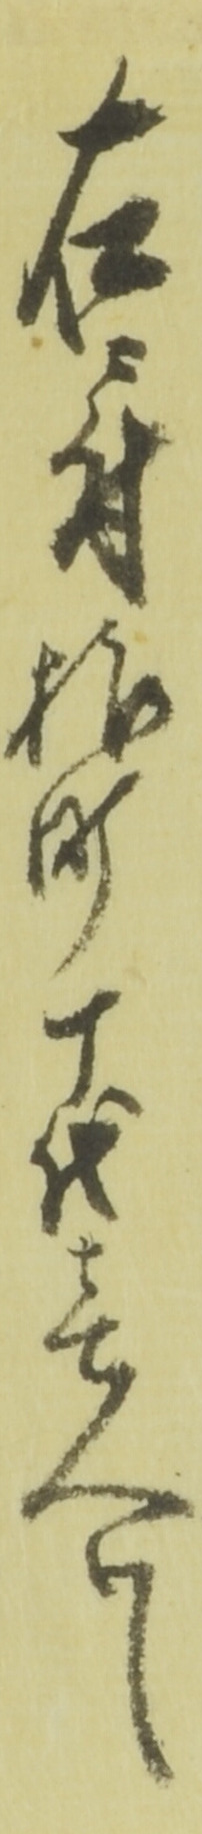右ニ付拾町丁代壱人ツヽ
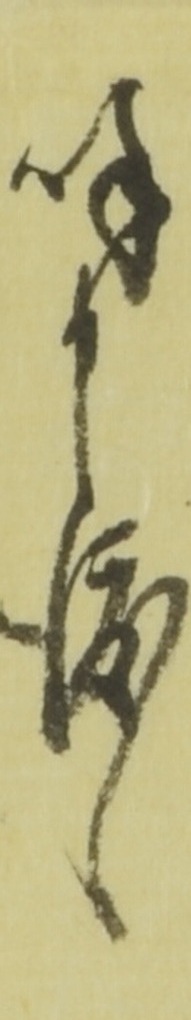呼申渡候
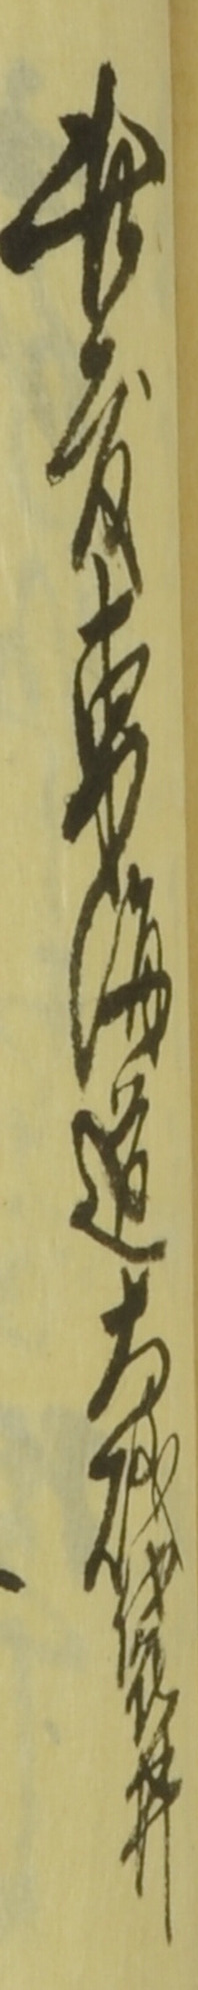此度東海道大磯袋井
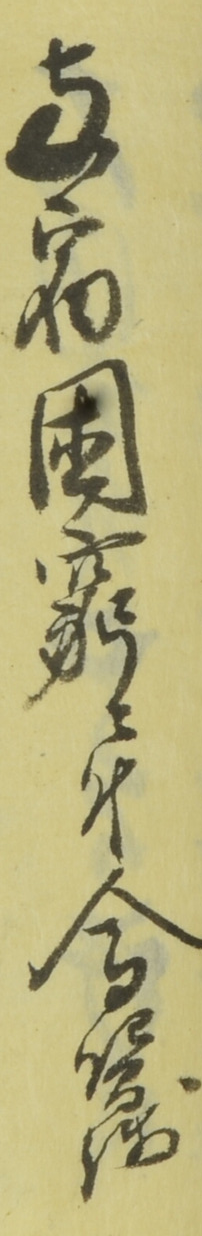両宿困窮ニ付金賃銭

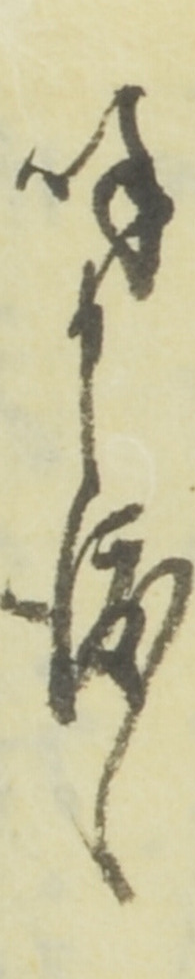呼申渡候
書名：御触書御書附控
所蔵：伊那市立高遠町図書館・合同会社AMANE
